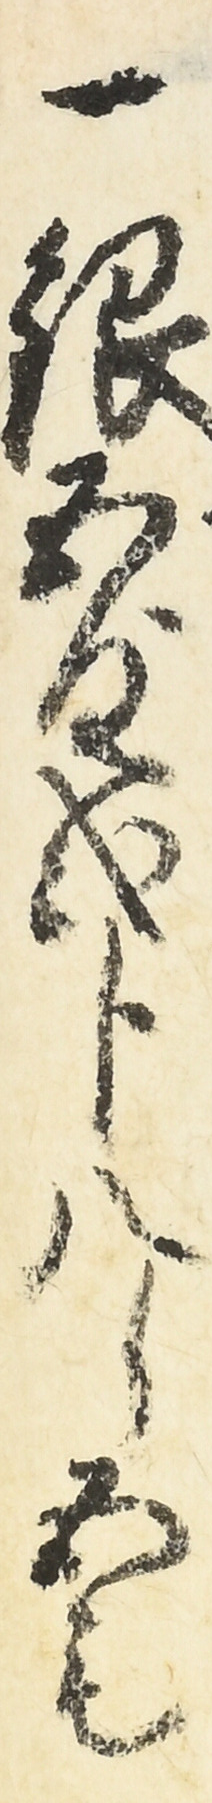一銀五匁弐分八厘五毛
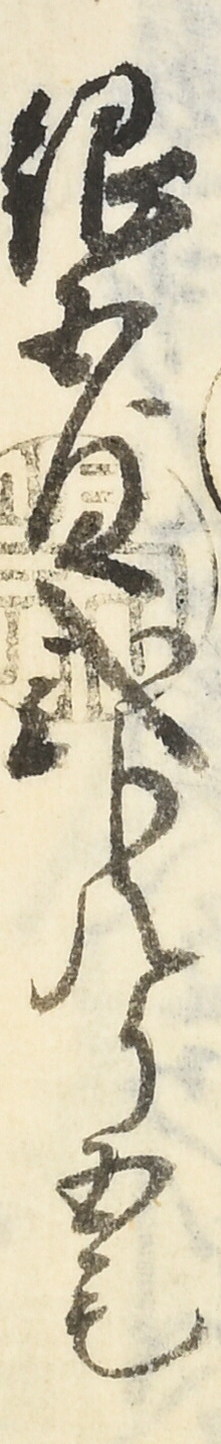一銀五匁弐分八厘五毛
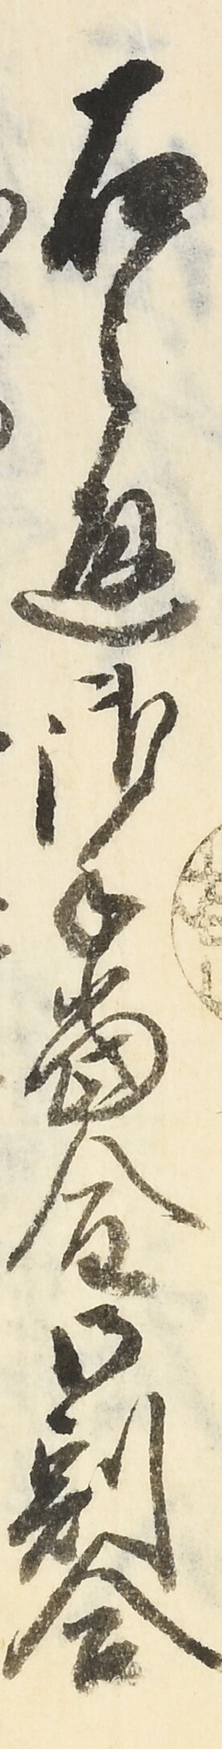右之通御手当金御割合
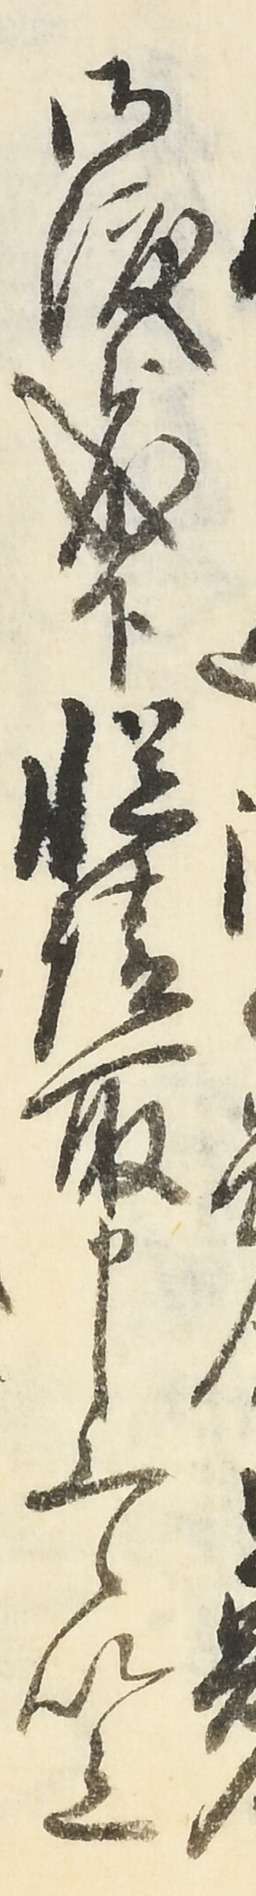御渡被成下慥請取申上候以上

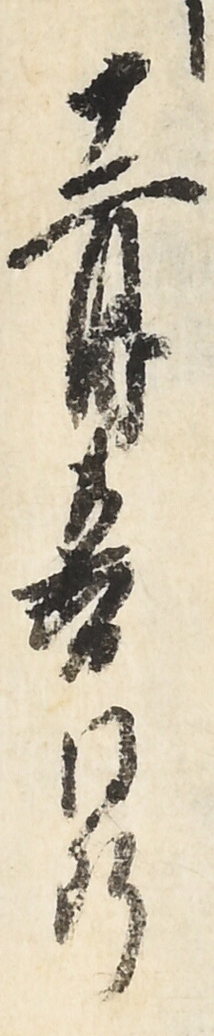十二月廿六日同断
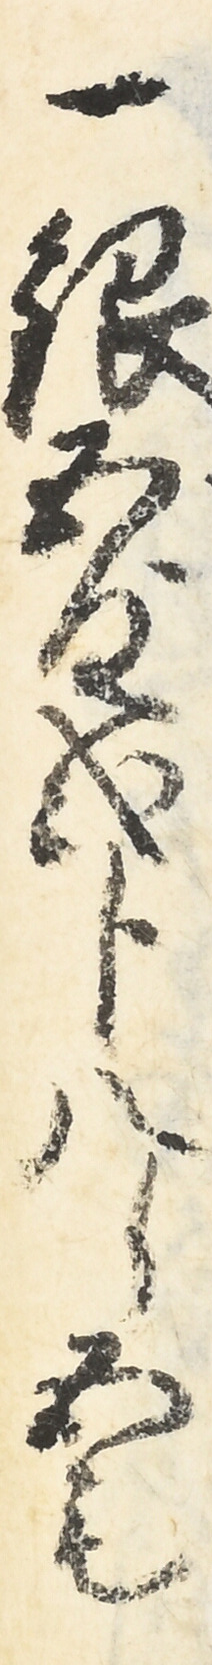銀五匁弐分八厘五毛
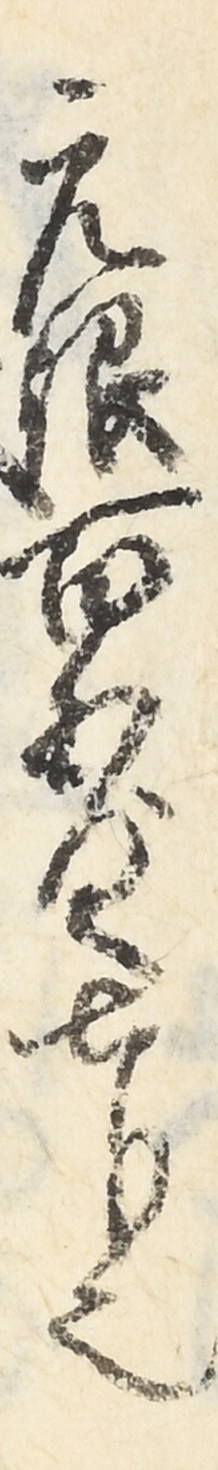元銀五拾匁五分也
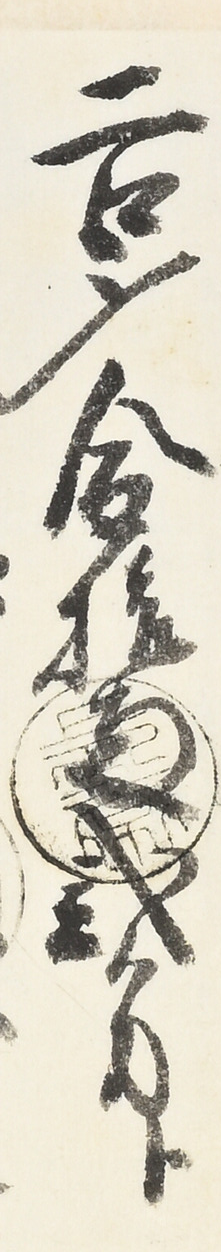二口〆金拾両弐分ト
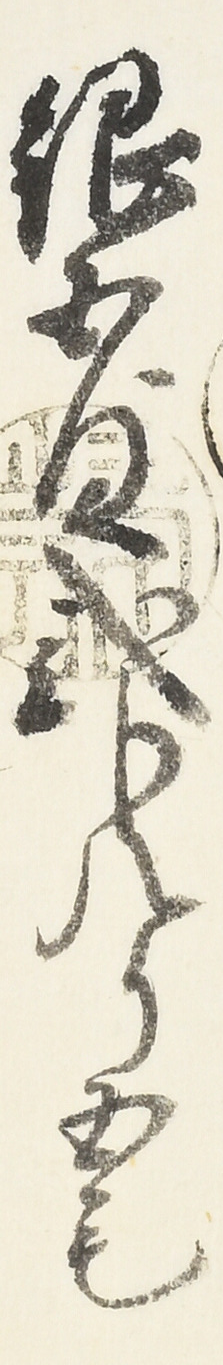銀五匁弐分八厘五毛
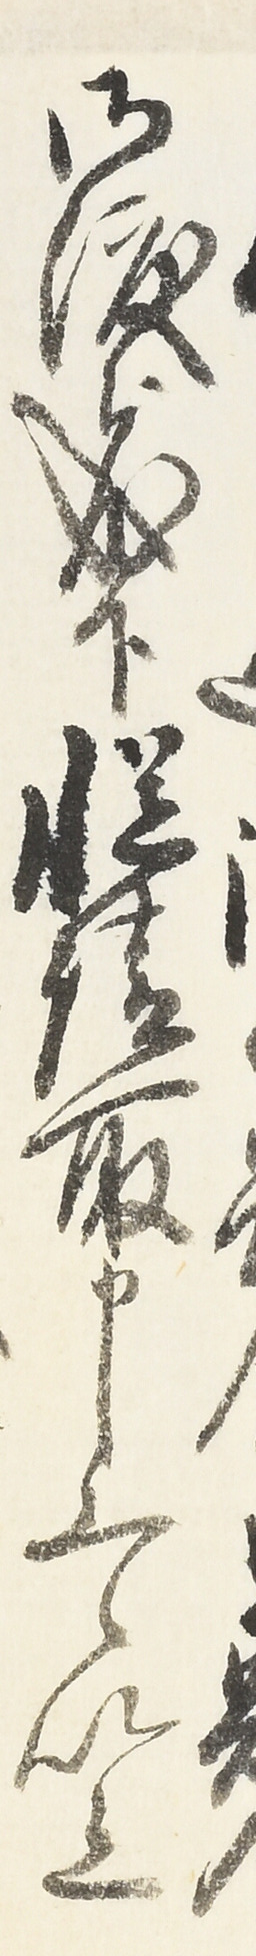御渡被成下慥請取申上候以上
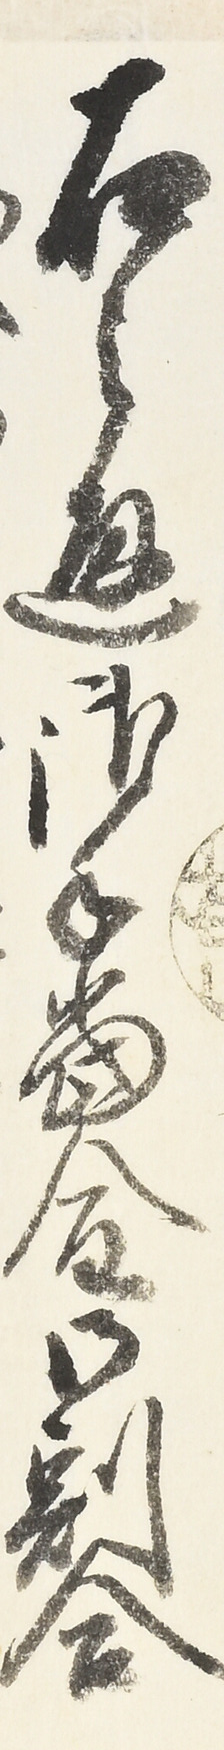右之通御手当金御割合
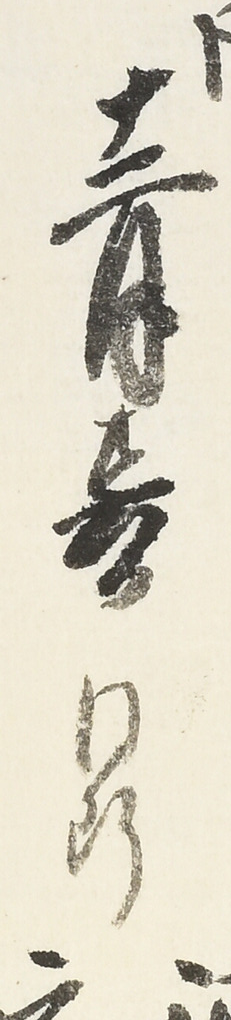十二月廿六日同断
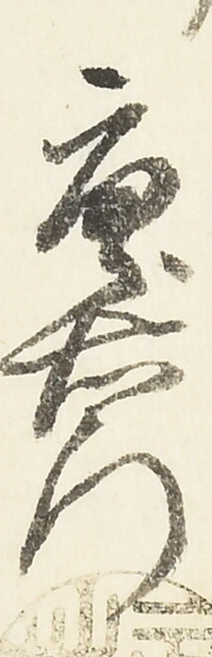市郎右衛門
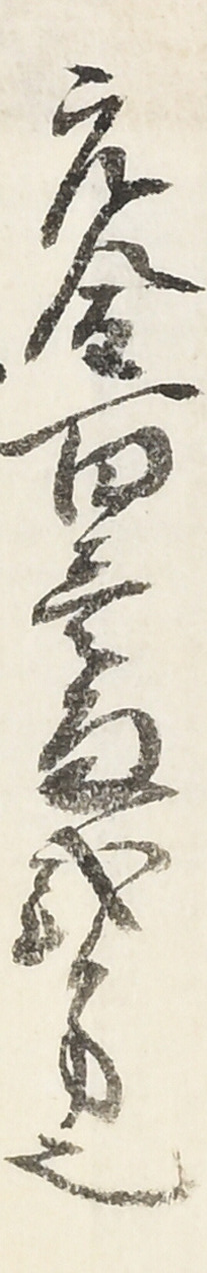元金百壱両弐分也
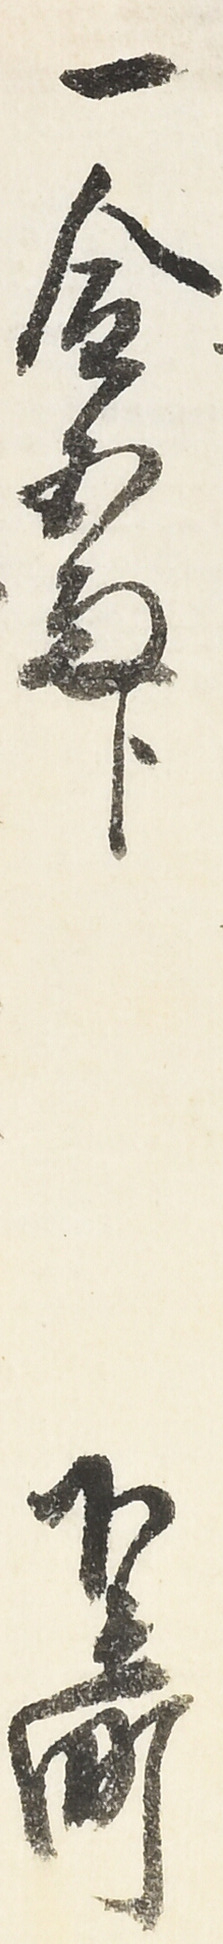一金五両ト下モ町
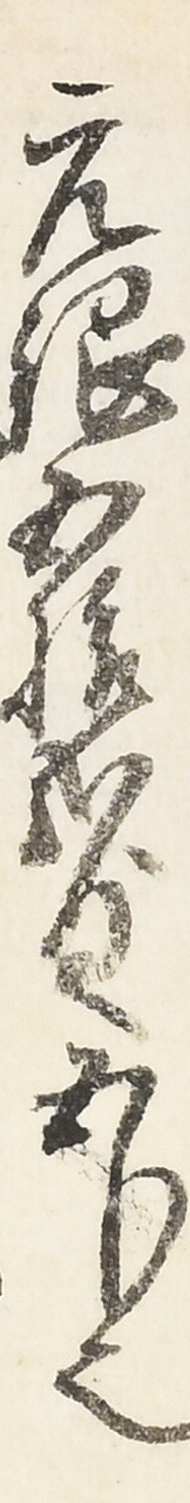元銀五拾弐匁五分也
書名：御才覚金御利足割渡扣帳
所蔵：伊那市立高遠町図書館・合同会社AMANE
